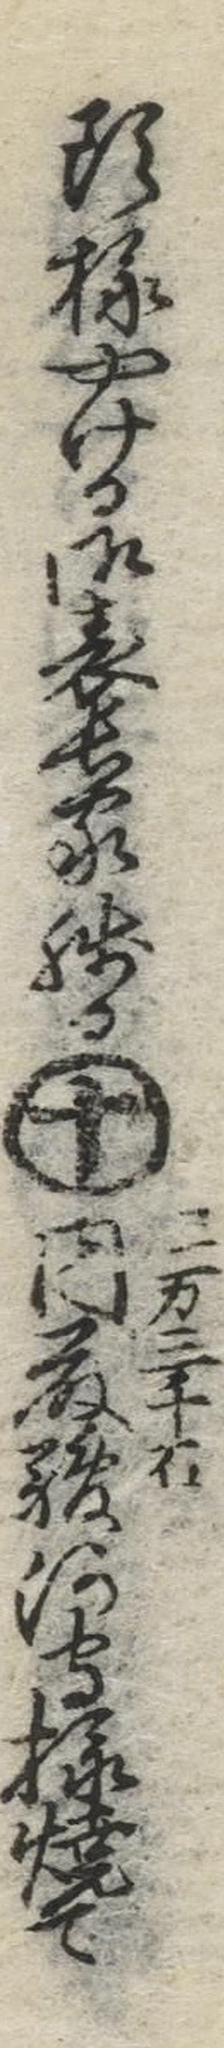頭様やける御表長屋残る内藤駿河守様焼て
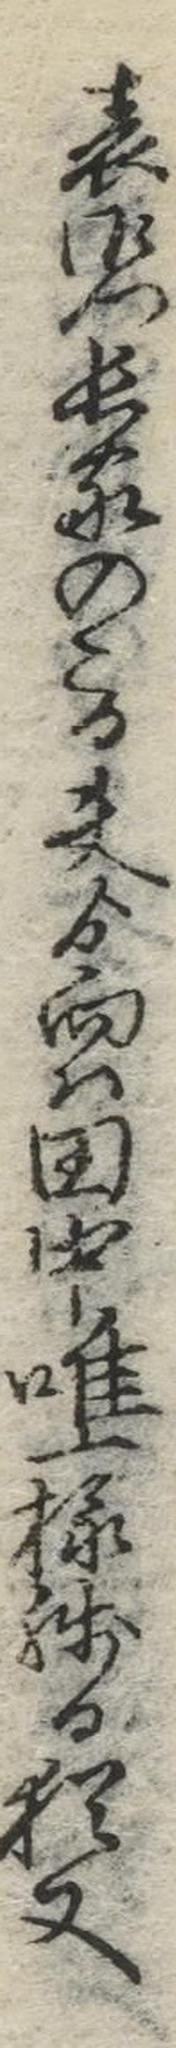表御門長家のこる夫ゟ向ハ田中唯一様残る猶又
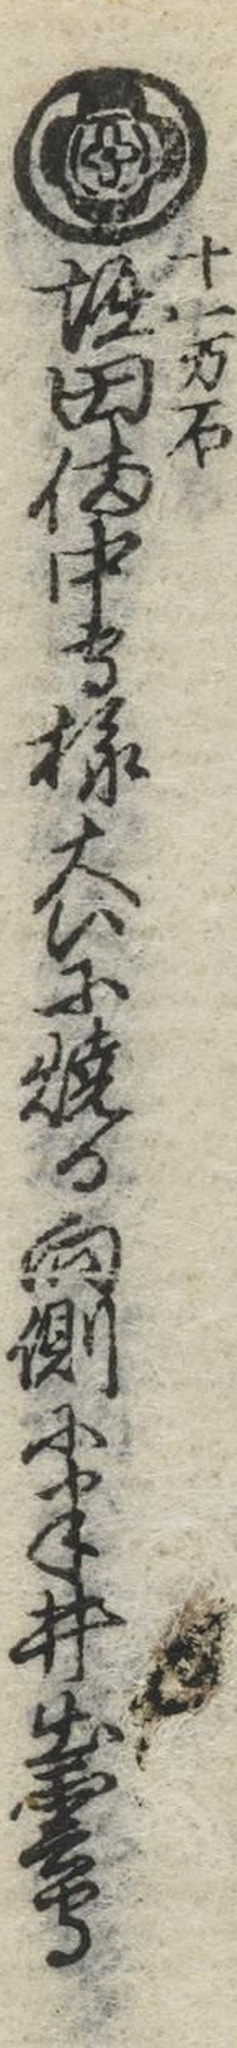堀田備中守様大いに焼る向側に半井出雲守
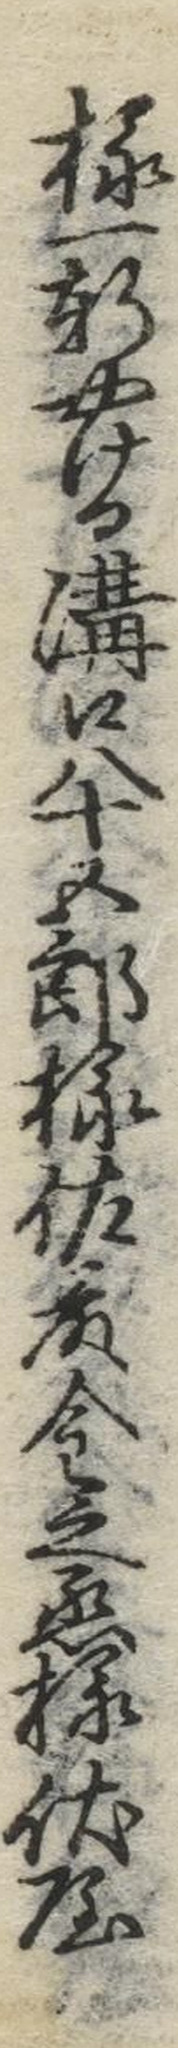様一軒やける溝口八十五郎様佐藤金之丞様伏屋
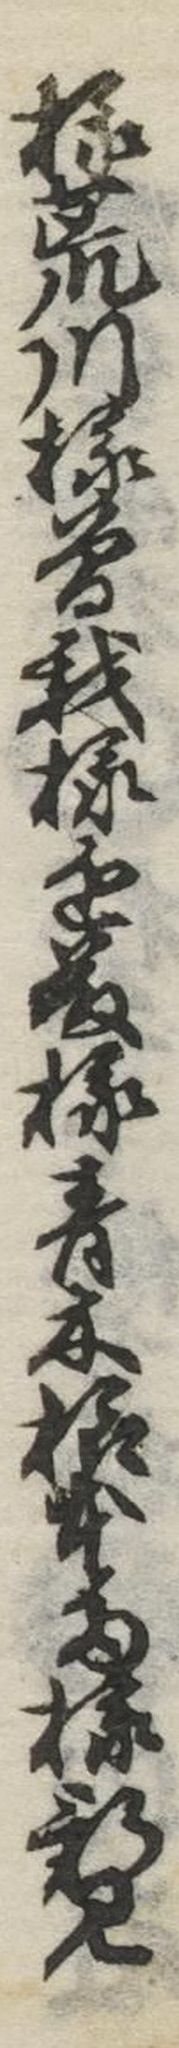様荒川様曽我様近藤様青木様本多様新見
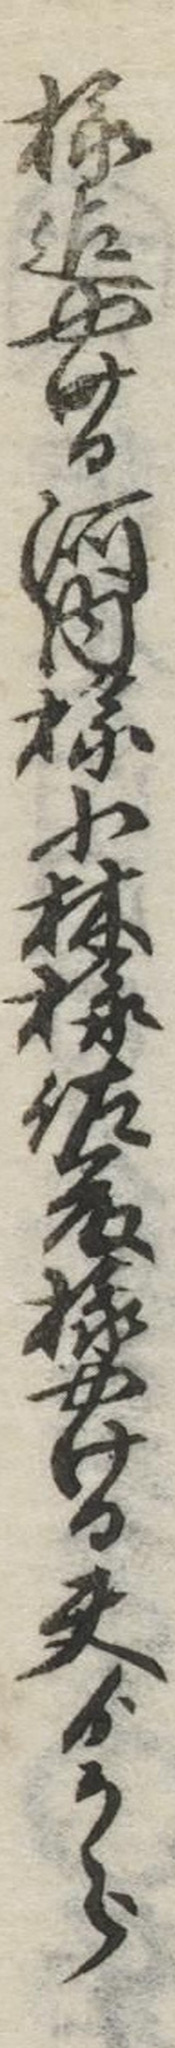様迄やける河内様小林様佐藤様やける夫ゟうら
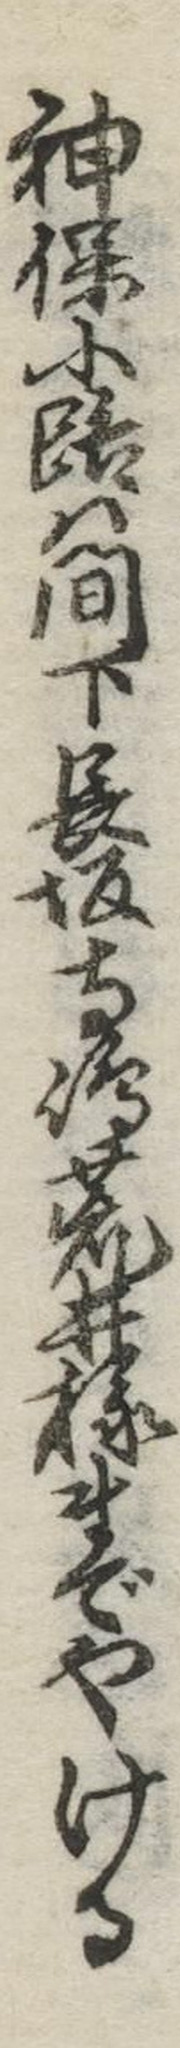神保小路ハ間下長坂寺嶋荒井様までやける
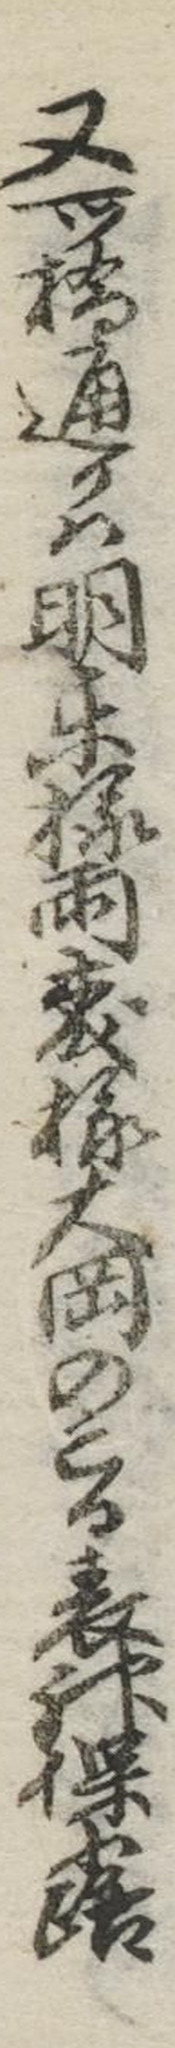又一ツ橋通りハ明楽様両森様大岡のこる表神保小路
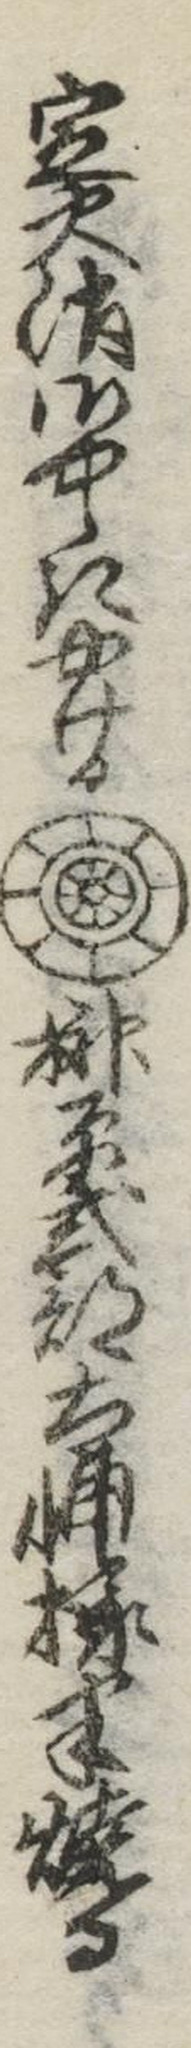定火消御やしきやける榊原式部大輔様半焼る
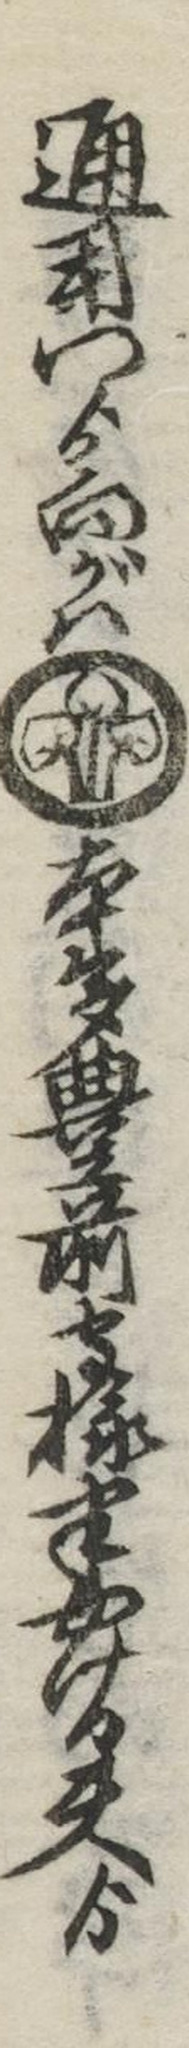通用門ゟ向ガハ本多豊前守様半やける夫ゟ
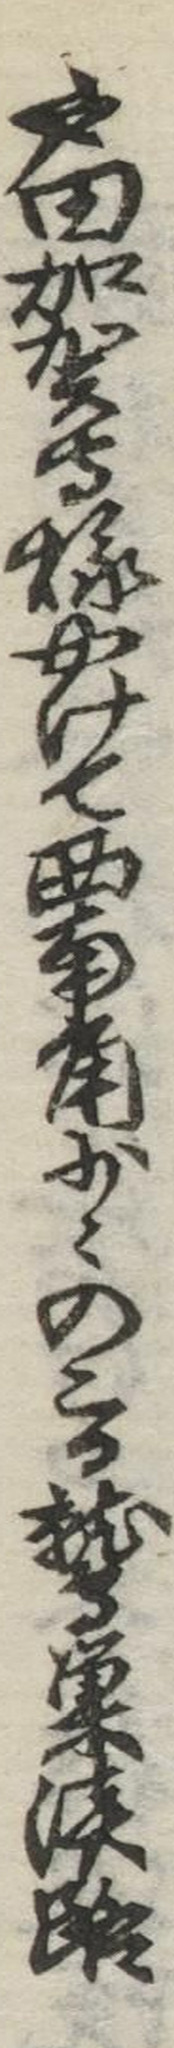戸田加賀守様やけて西南角少〻のこる鷲巣淡路

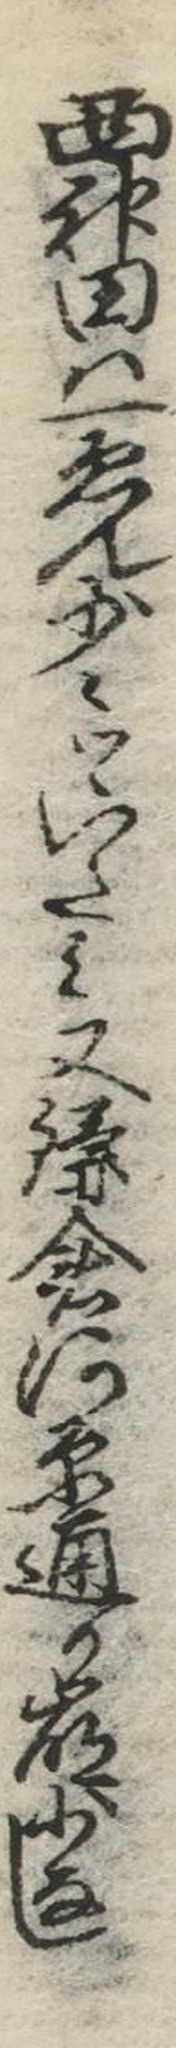西神田ハ一めん少〻ツヽいたミ又鎌倉河原通り崩少なし
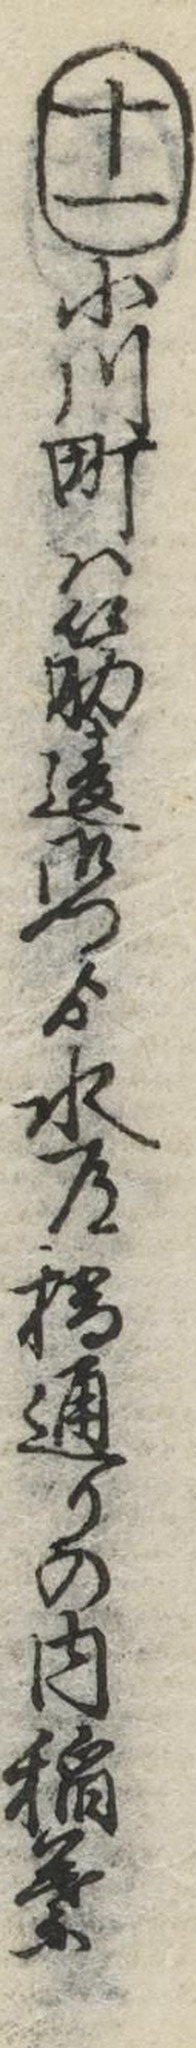十一小川町ハ筋違御門ゟ水道橋通りの内稲葉
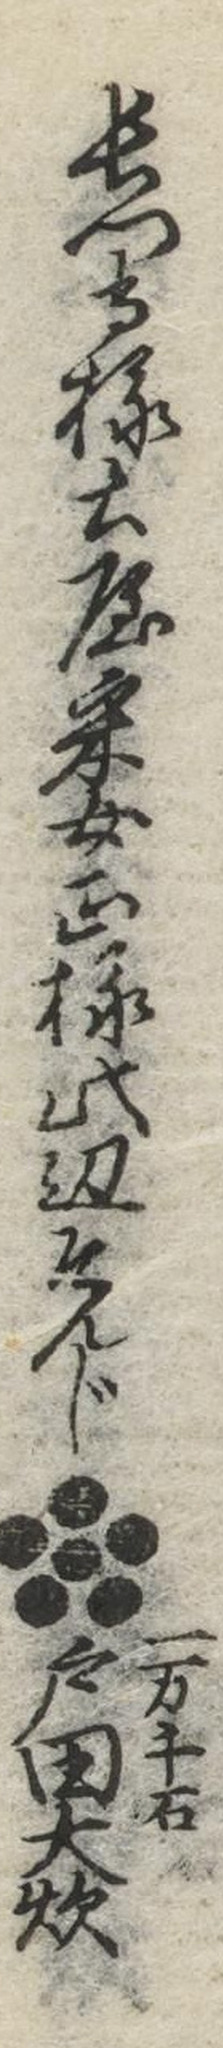長門守様土屋采女正様此辺そんじ戸田大炊
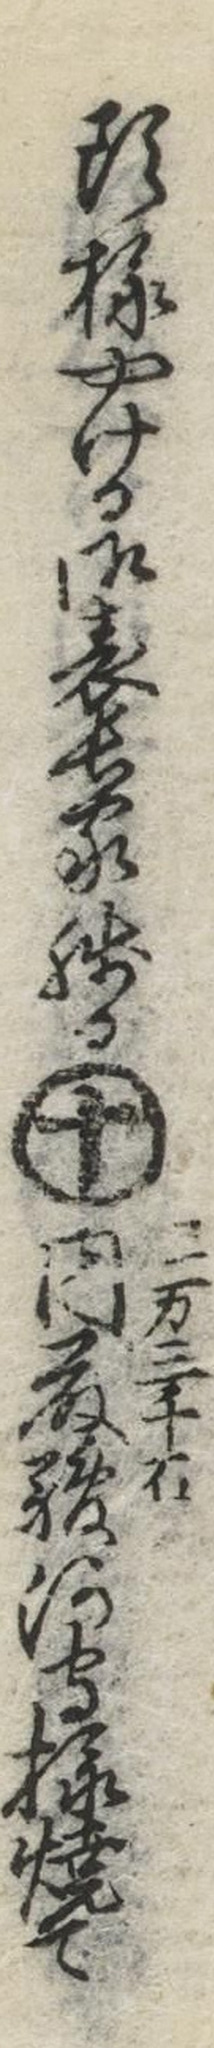頭様やける御表長屋残る内藤駿河守様焼て
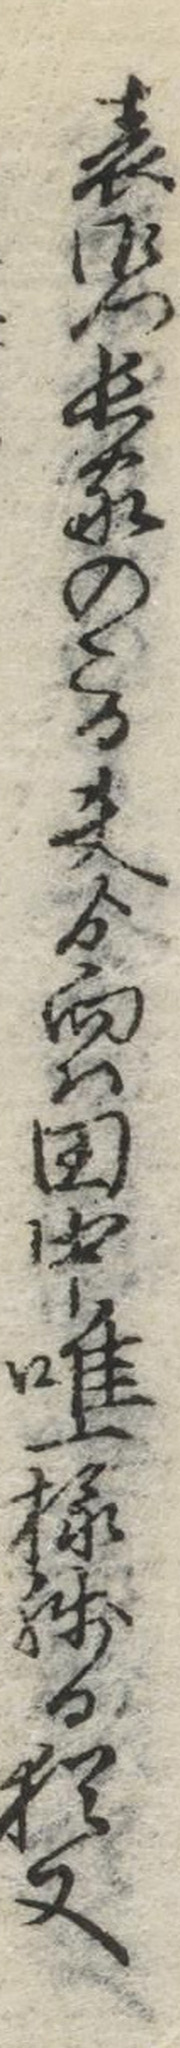表御門長家のこる夫ゟ向ハ田中唯一様残る猶又
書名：江戸御屋鋪方町方共　地震類焼場所巨細書之寫　潰家潰土蔵共取調附街道筋近在迄
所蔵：東京大学地震研究所図書室 Earthquake Research Institute Library, The University of Tokyo, JAPAN
